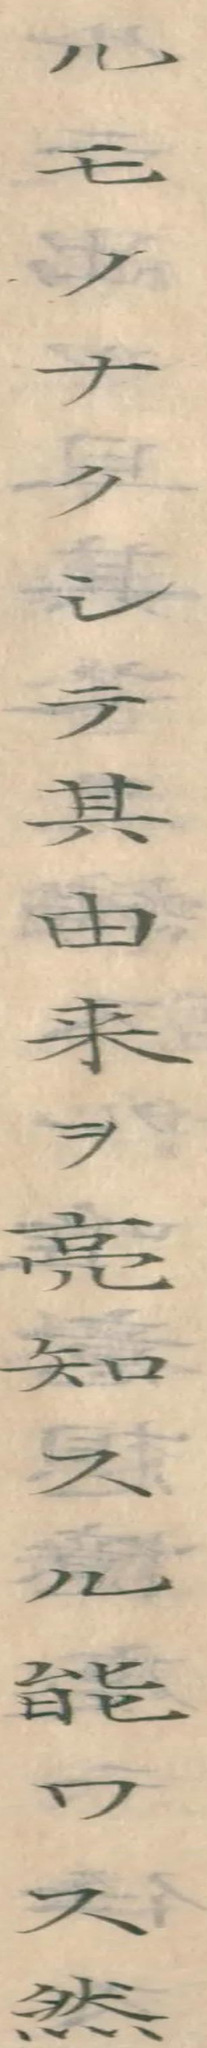ルモノナクシテ其由来ヲ亮知スル能ワス然
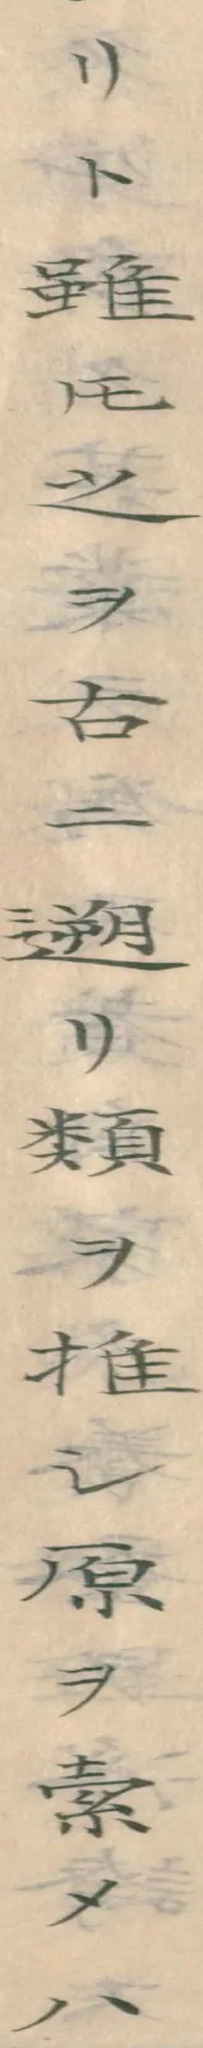リト雖トモ之ヲ古ニ遡リ類ヲ推シ原ヲ索メハ
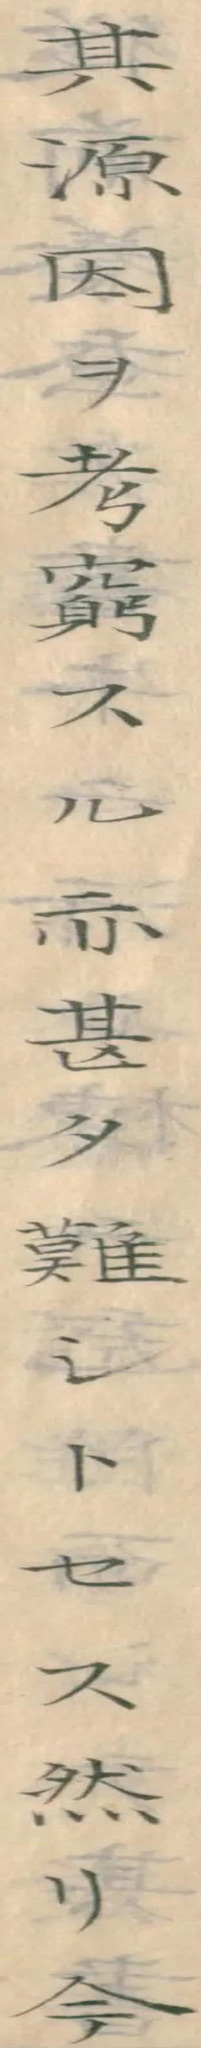其源因ヲ考窮スル亦甚タ難シトセス然リ今
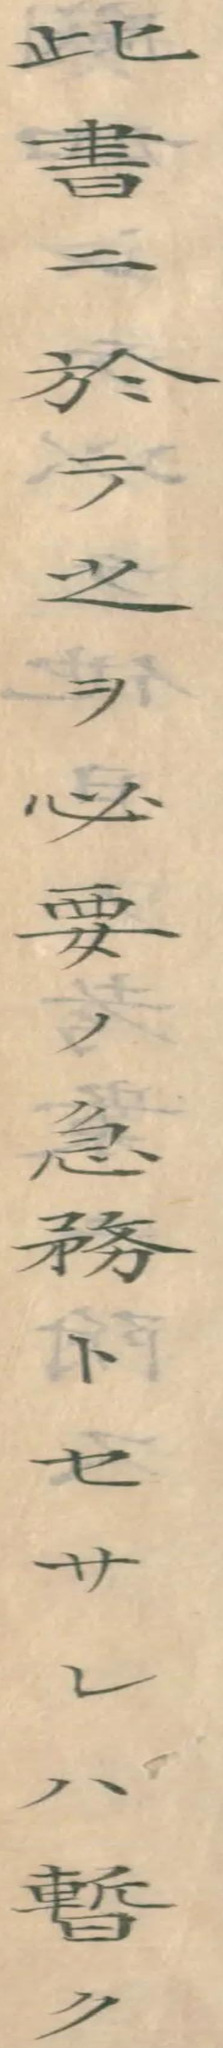此書ニ於テ之ヲ必要ノ急務トセサレハ暫ク

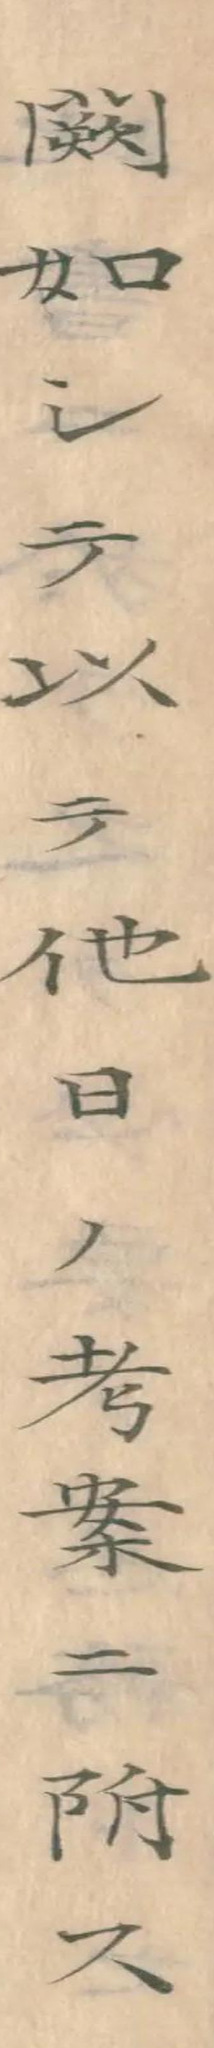闕如シテ以テ他日ノ考案ニ附ス
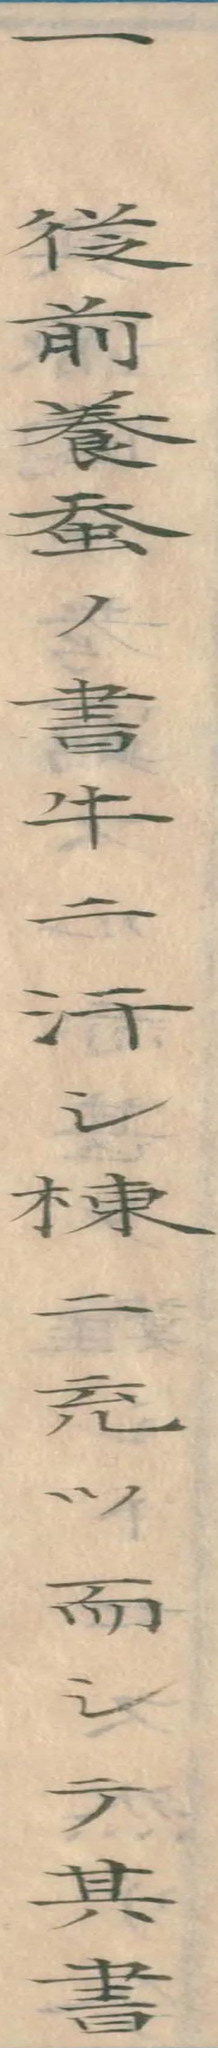一従前養蚕ノ書牛ニ汗シ棟ニ充ツ而シテ其書
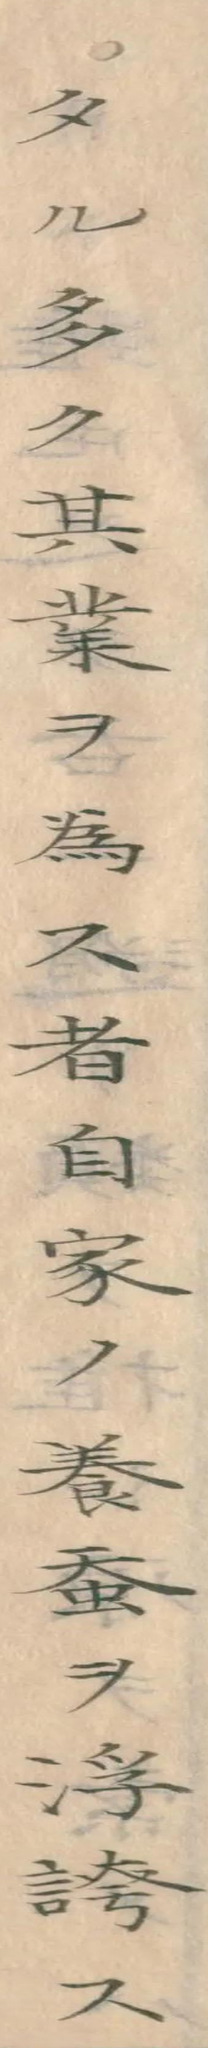タル多ク其業ヲ為ス者自家ノ養蚕ヲ浮誇ス
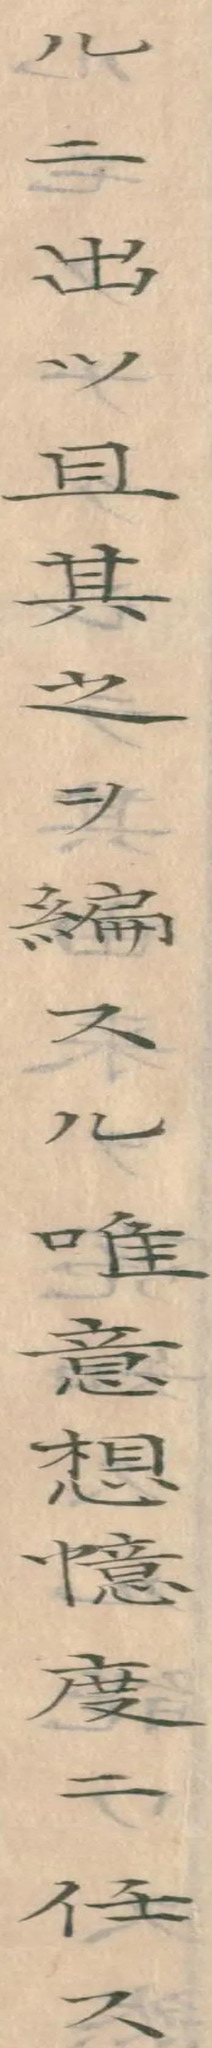ルニ出ツ且其之ヲ編スル唯意想憶度ニ任ス
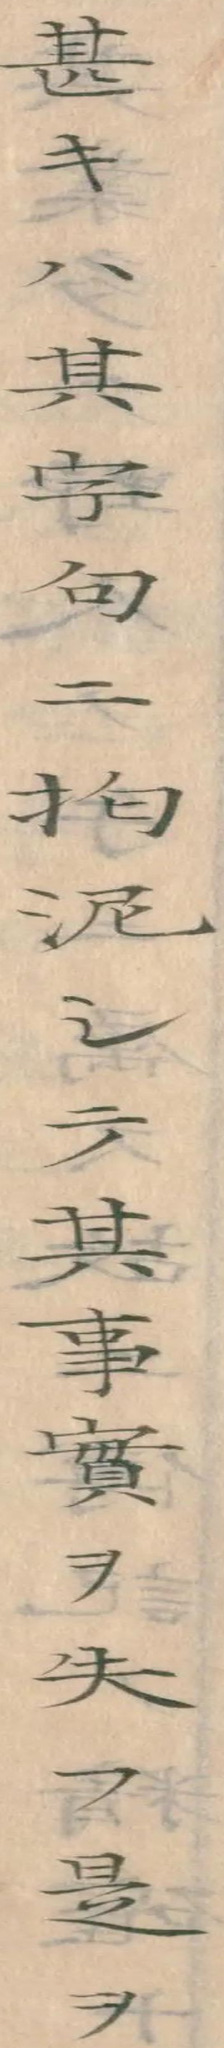甚キハ其字句ニ拘泥シテ其事実ヲ失フ是ヲ
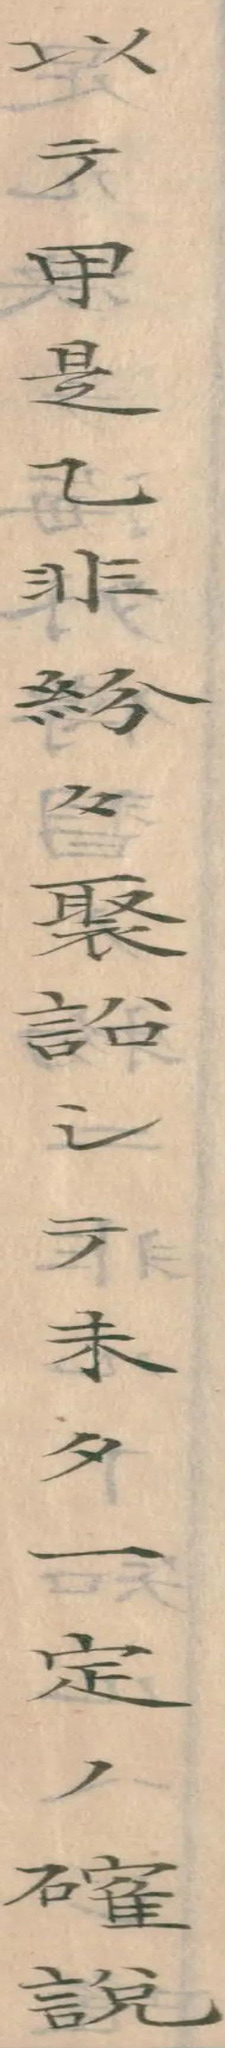以テ甲是乙非紛々聚䛇シテ未タ一定ノ確説
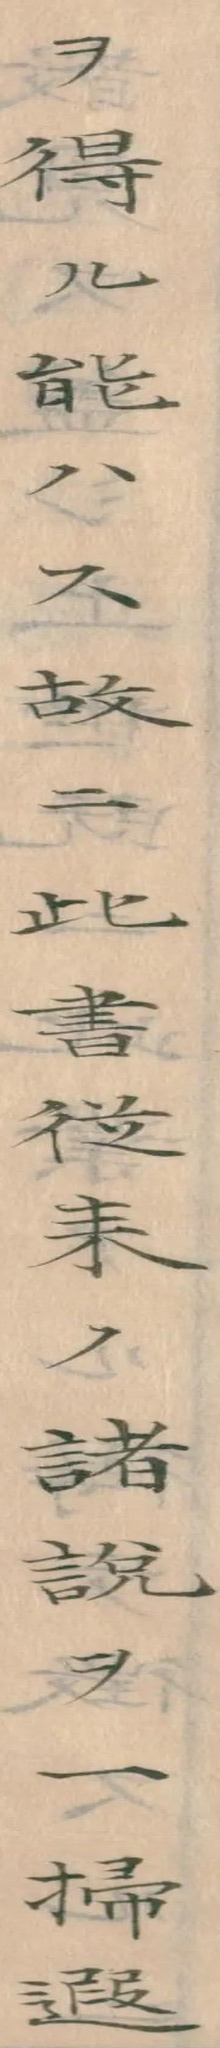ヲ得ル能ハス故ニ此書従来ノ諸説ヲ一掃遐
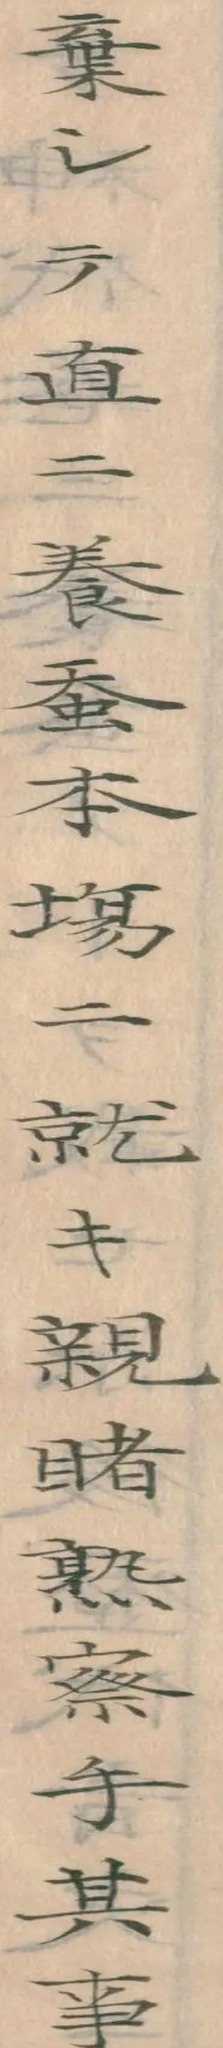棄シテ直ニ養蚕本場ニ就キ親睹熟察手其事
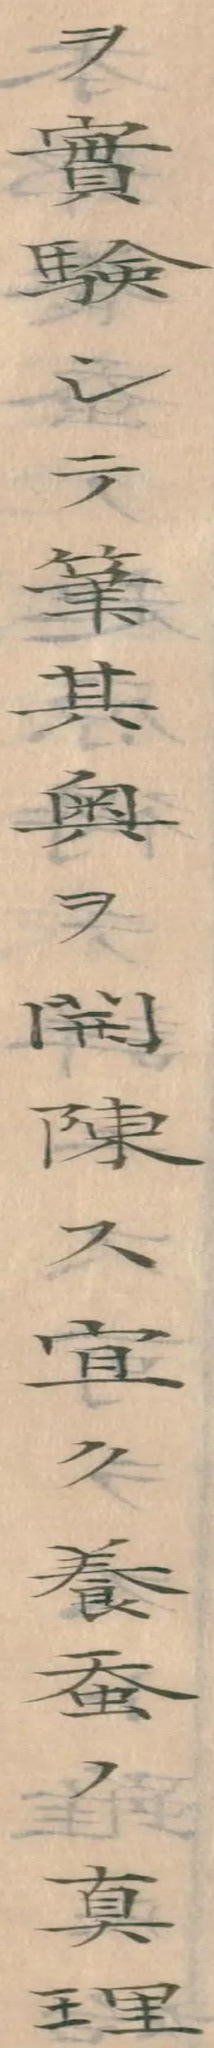ヲ実験シテ筆其奥ヲ開陳ス宜ク養蚕ノ真理
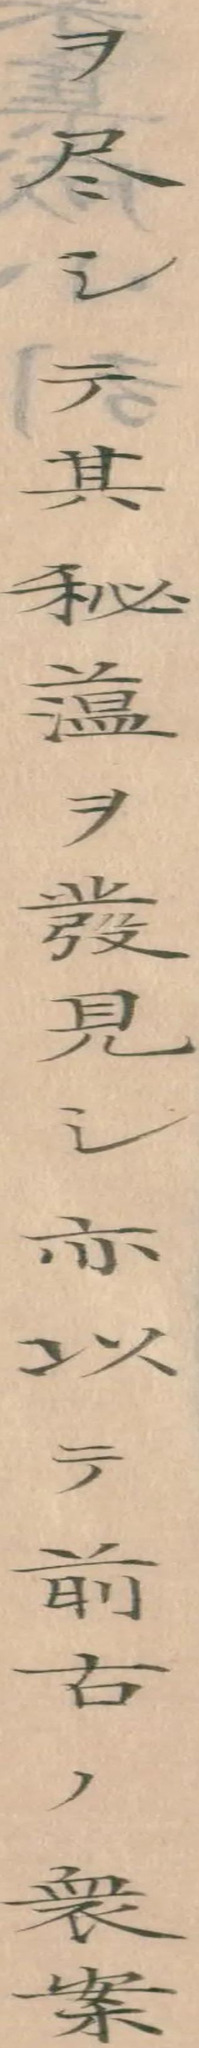ヲ尽シテ其秘薀ヲ発見シ亦以テ前古ノ衆案
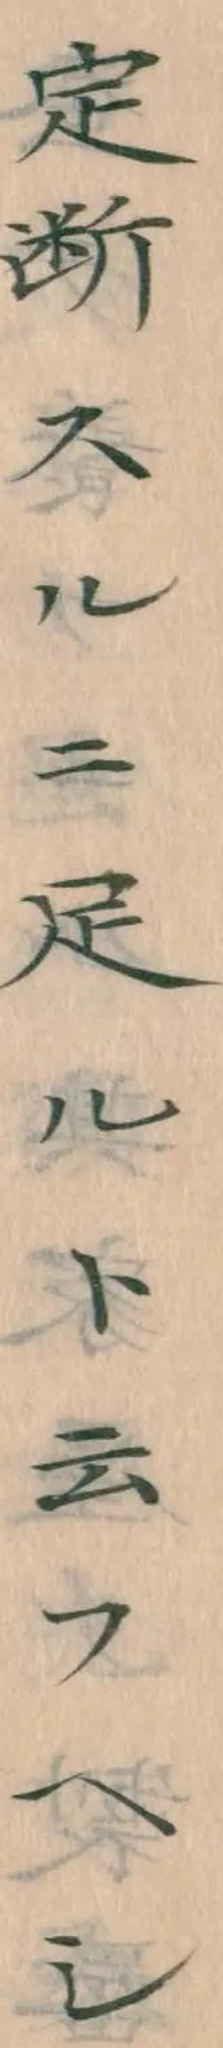定断スルニ足ルト云フヘシ
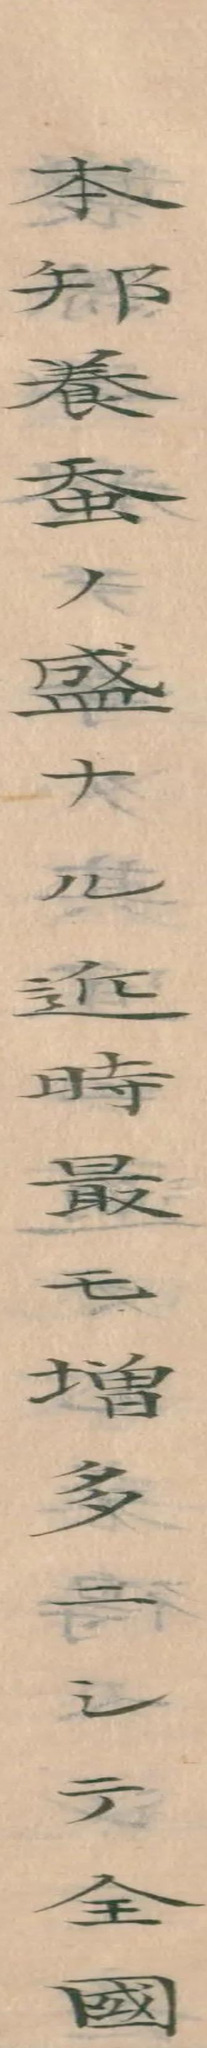一本邦養蚕ノ盛ナル近時最モ増多ニシテ全国
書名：蚕桑集成
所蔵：国立国会図書館 National Diet Library, JAPAN
